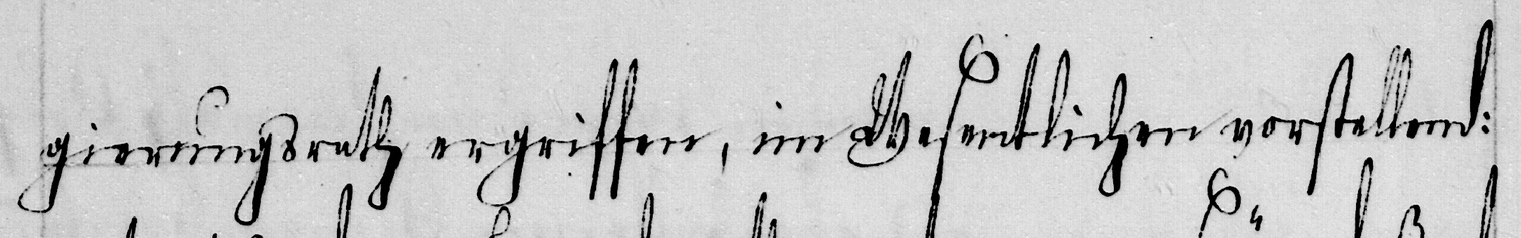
gierungsrath ergriffen, im Wesentlichen vorstellen¬
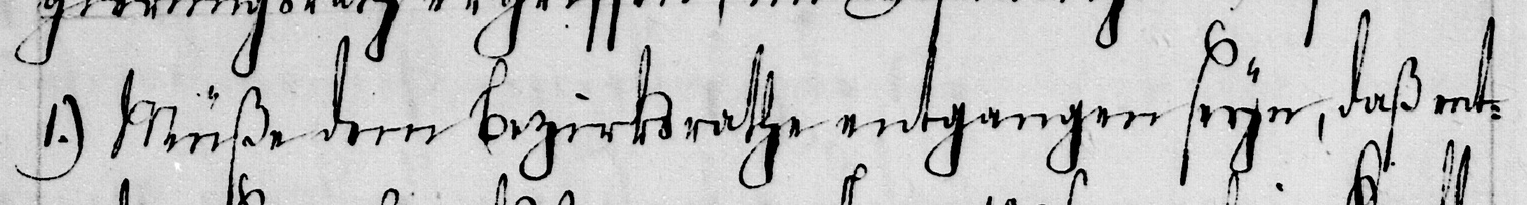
1.) Müße dem Bezirksrathe entgangen seyn, daß ent¬
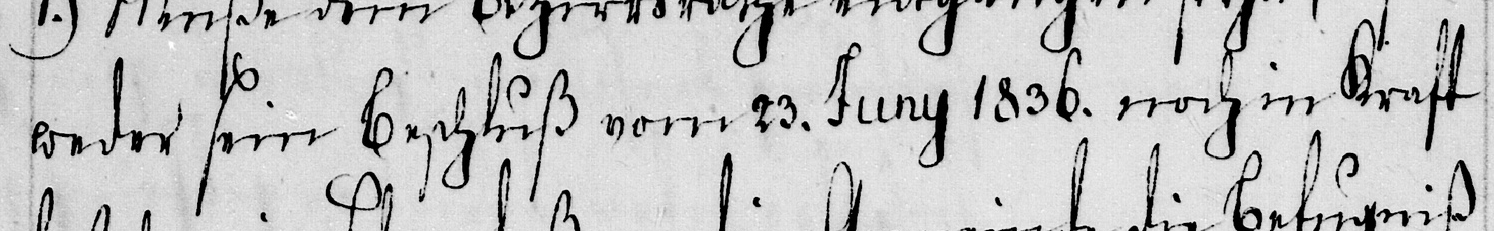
weder sein Beschluß vom 23. Juny 1836. noch in Kraft
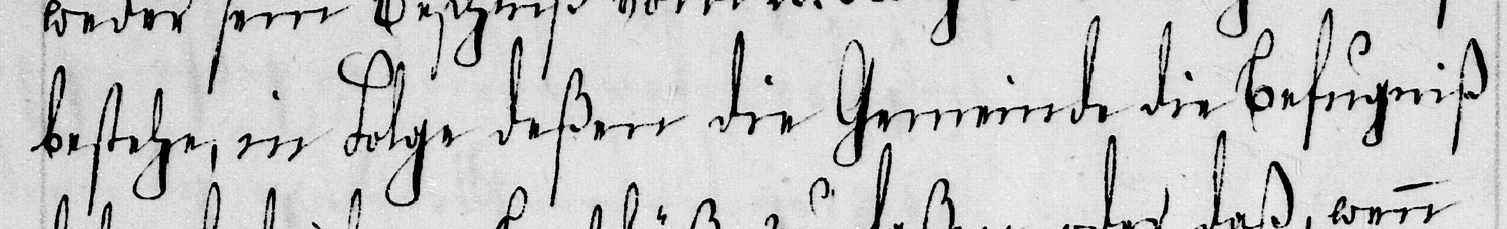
bestehe, in Folge deßen die Gemeinde die Befugniß
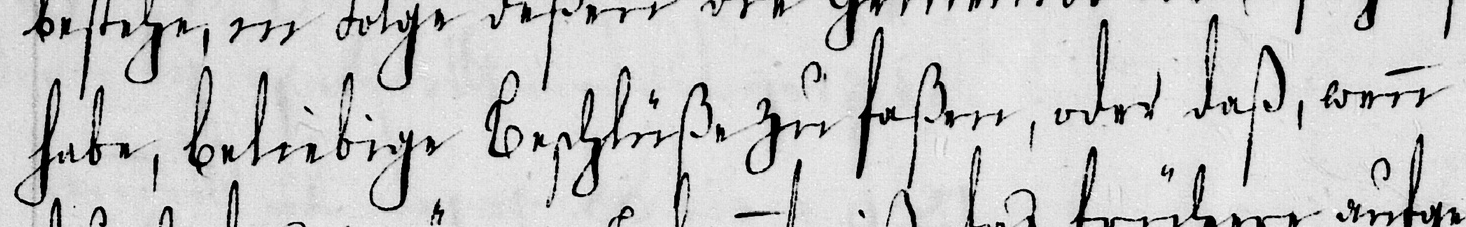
habe, beliebige Beschlüße zu faßen, oder daß, wenn
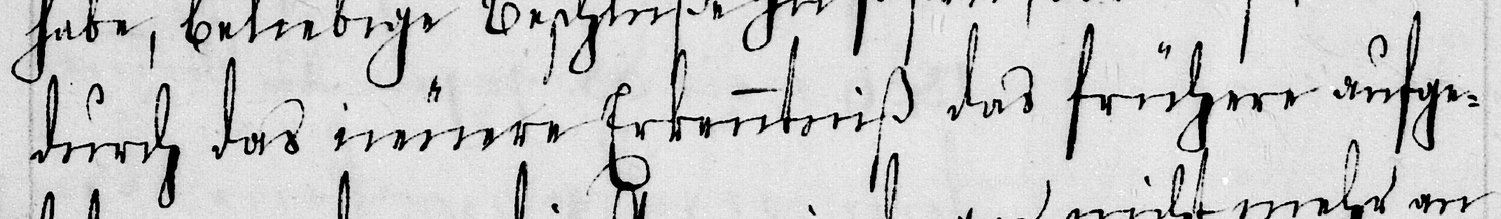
durch das neuere Erkenntniß das frühere aufge¬
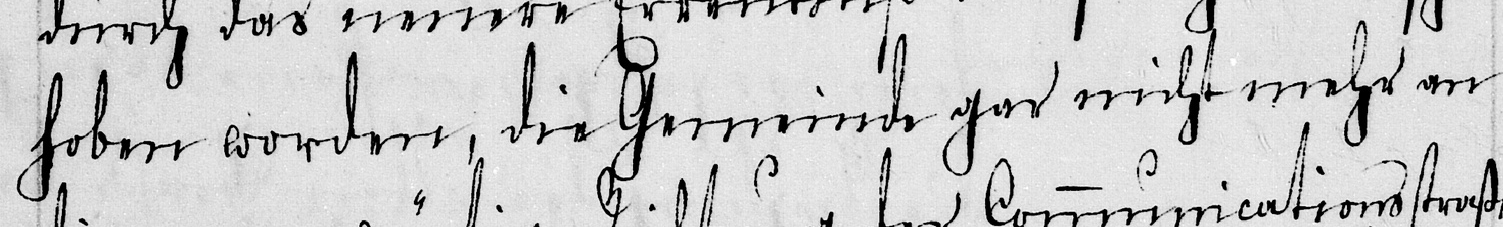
hoben worden, die Gemeinde gar nicht mehr an
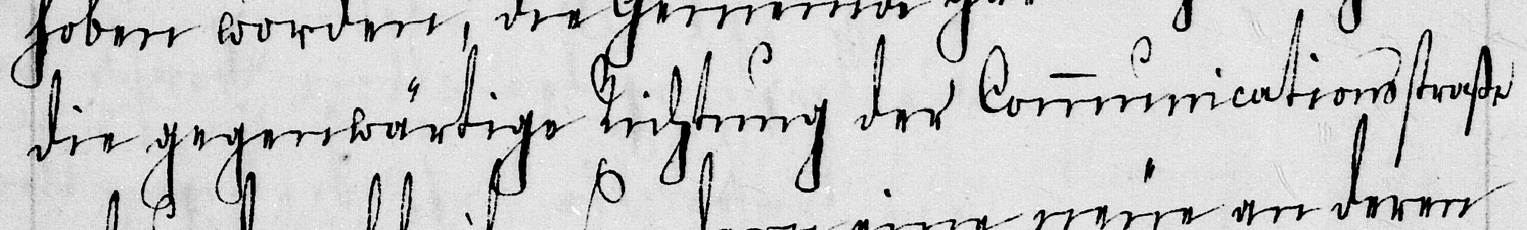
die gegenwärtige Richtung der Communicationsstraße
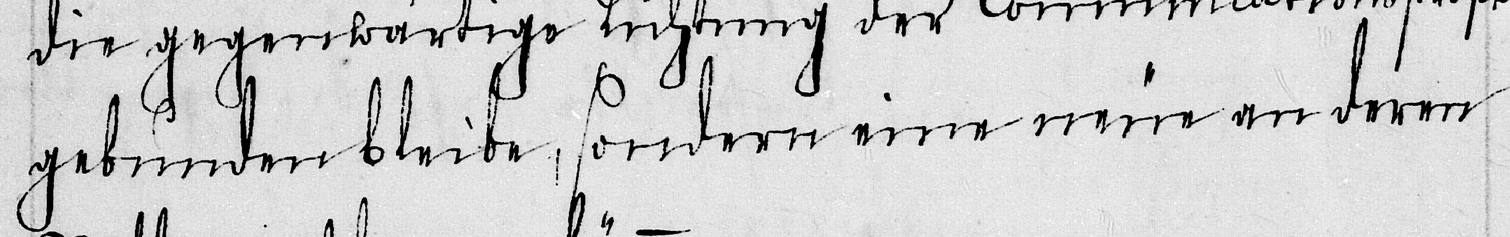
gebunden bleibe, sondern eine neue an deren
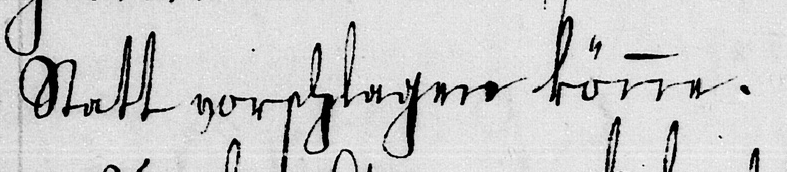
Statt vorschlagen könne.
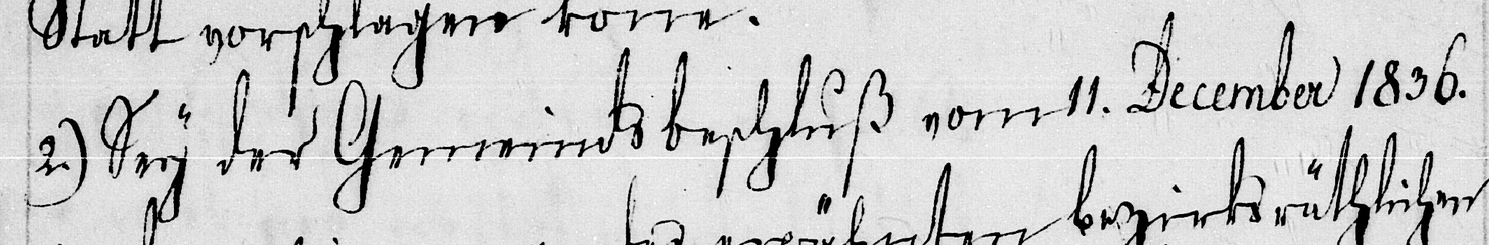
2.) Sey der Gemeindsbeschluß vom 11. December 1836.
